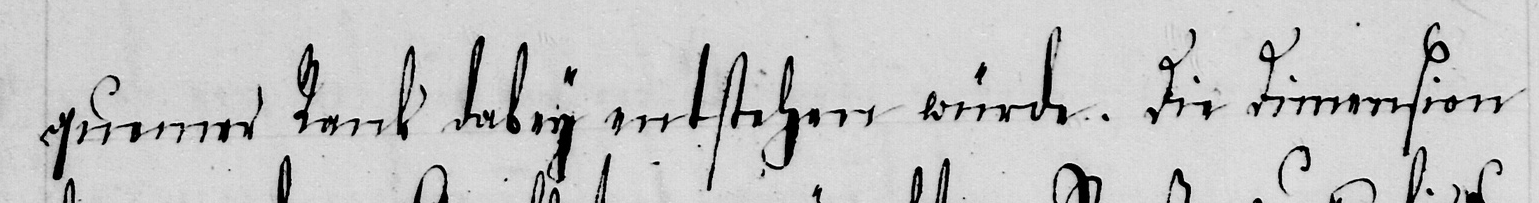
quemer Rank dabey entstehen würde. Die Dimension
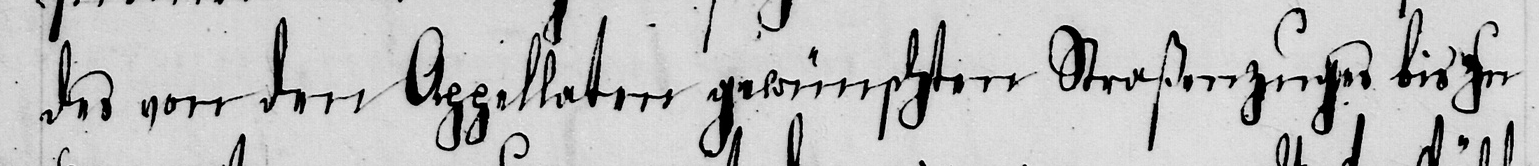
des von den Appellaten gewünschten Straßenzuges bis zu
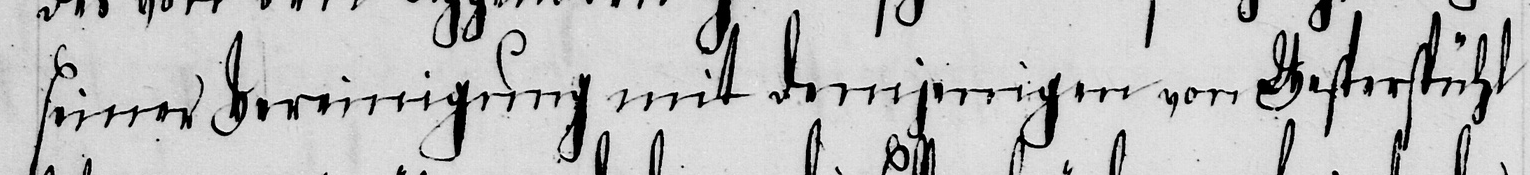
seiner Vereinigung mit demjenigen von Wesperspühl
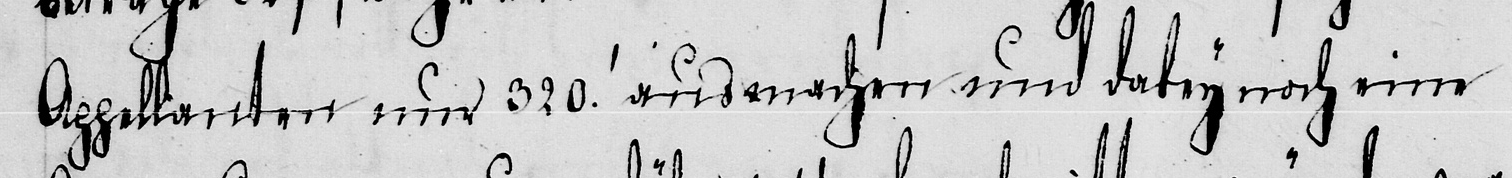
Appellanten nur 320 [Fuss]. ausmachen und dabey noch eine
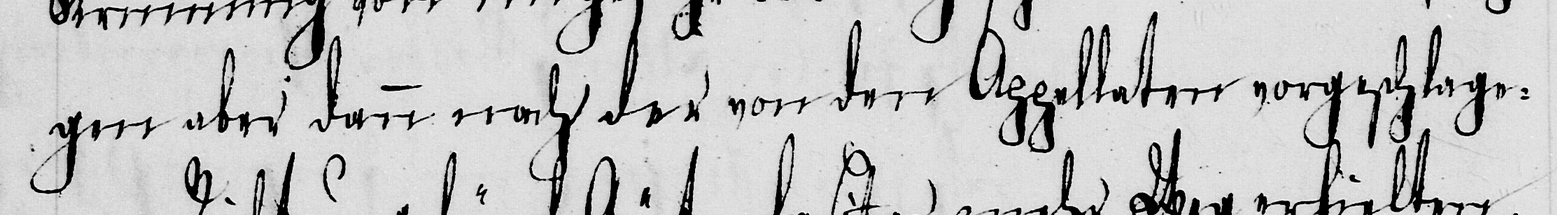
egen aber dann nach der von den Appellaten vorgeschlage¬
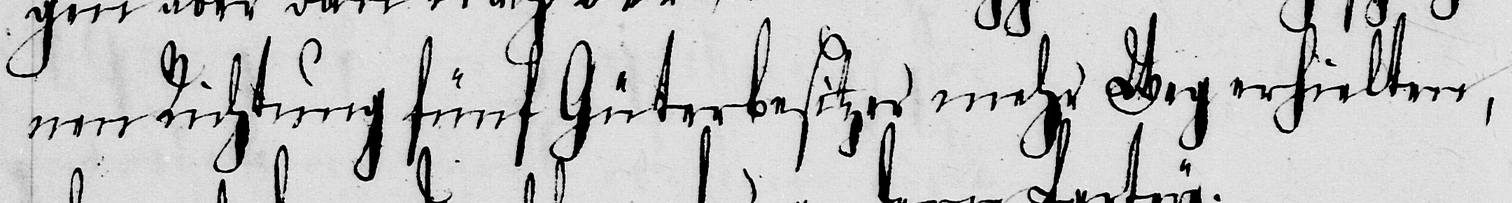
nen Richtung fünf Güterbesitzer mehr Weg erhielten,
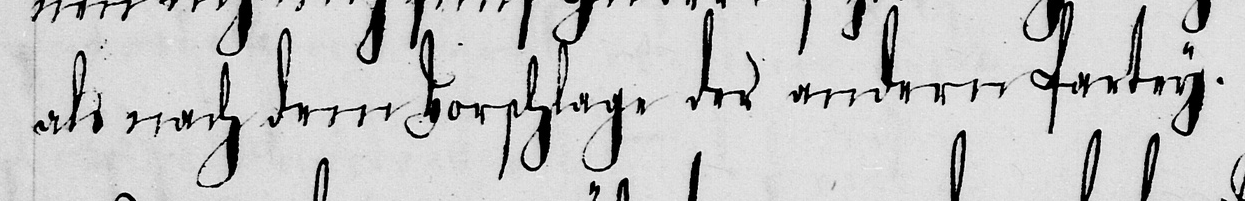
als nach dem Vorschlage der andern Partey.
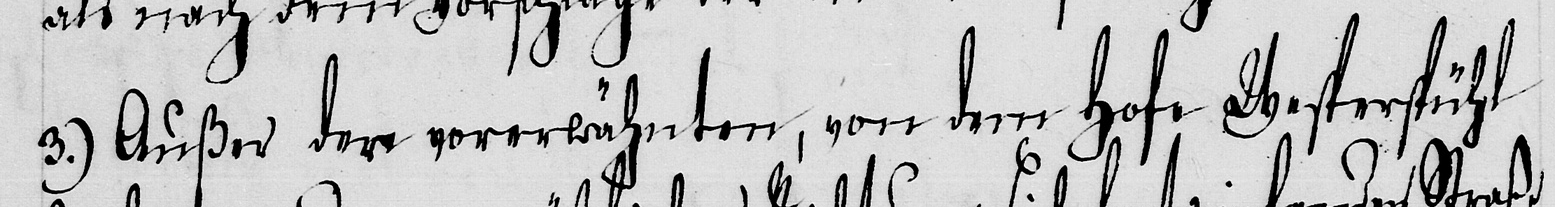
3.) Außer der vorerwähnten, von dem Hofe Wesperspühl
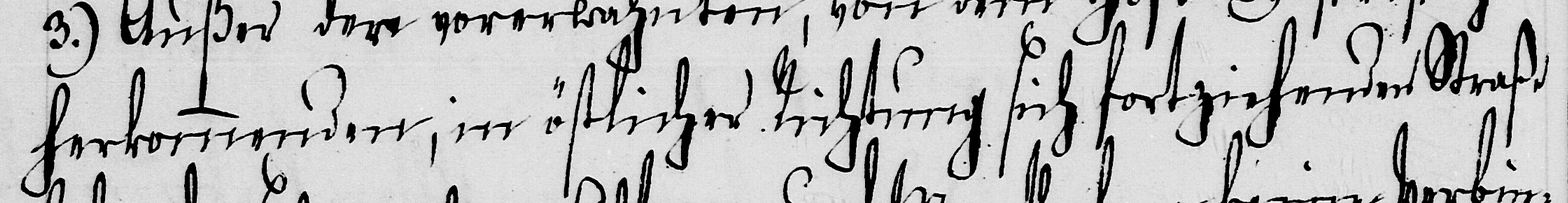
herkommenden, in östlicher Richtung sich fortziehenden Straße
